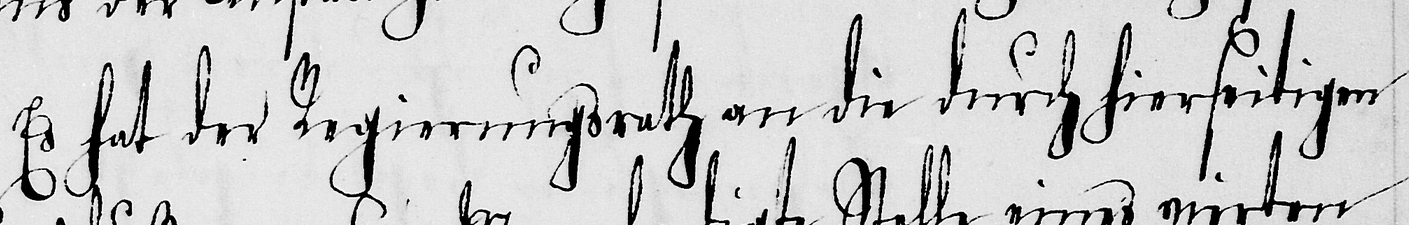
Es hat der Regierungsrath an die durch hierseitigen
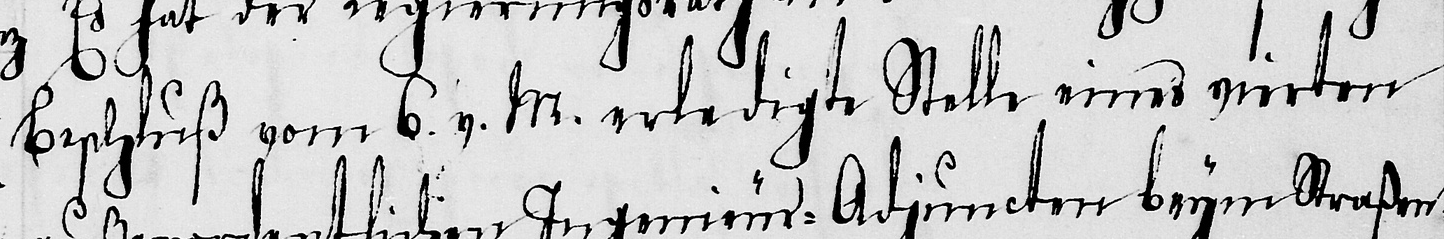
Beschluß vom 6. v. M. erledigte Stelle eines vierten
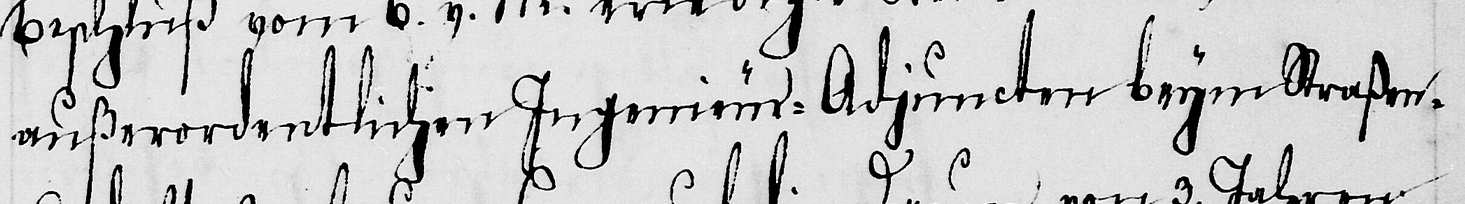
außerordentlichen Ingenieur-Adjuncten beym Straßen-
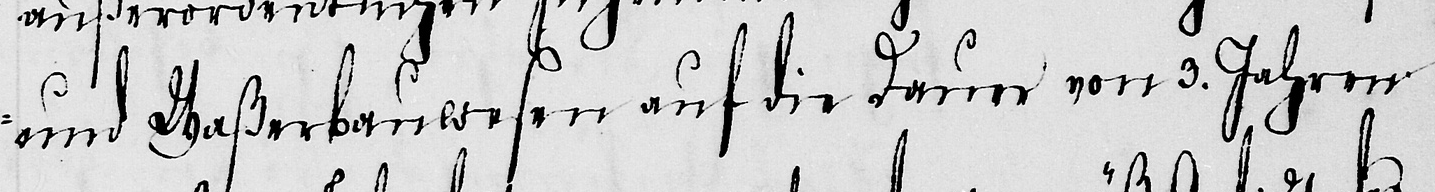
und Waßerbauwesen auf die Dauer von 3. Jahren
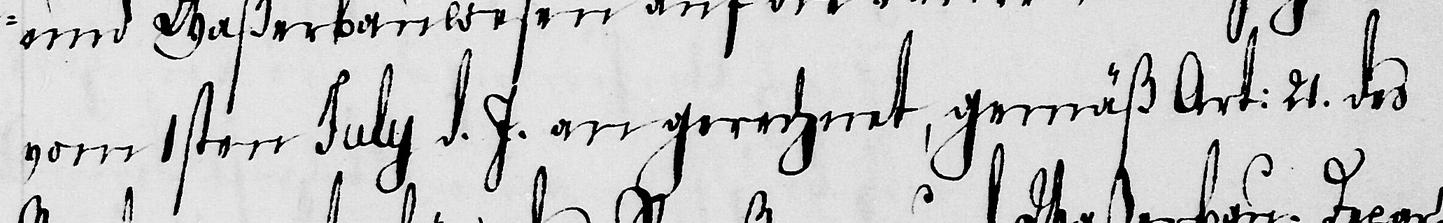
vom 1sten July d. J. an gerechnet, gemäß Art: 21. des
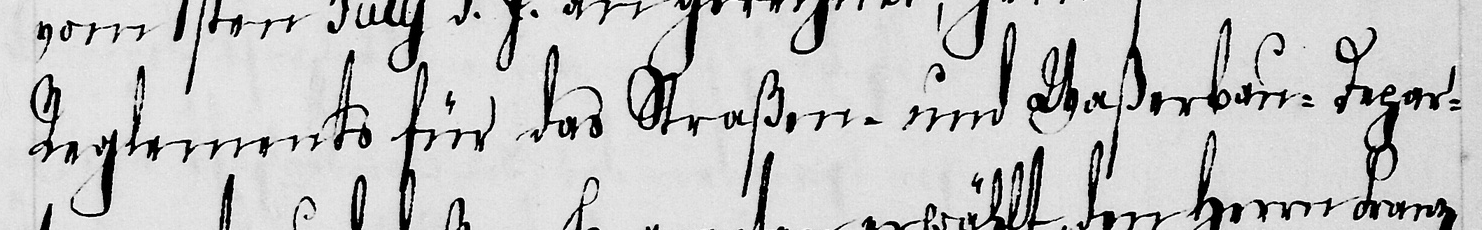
Reglements für das Straßen- und Waßerbau-Depar¬
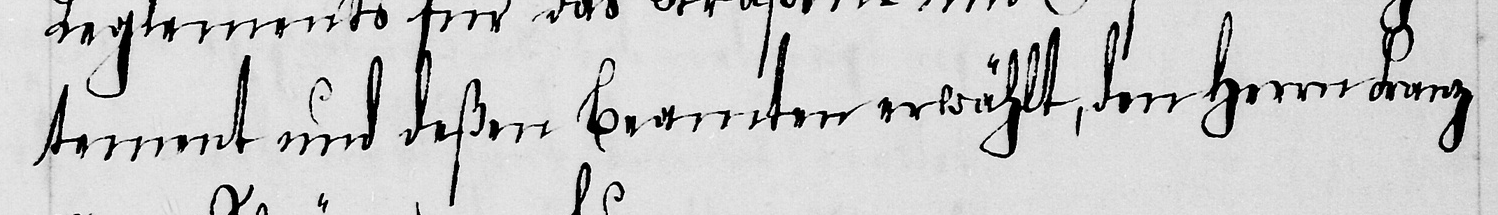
tement und deßen Beamten erwählt, den Herrn Franz
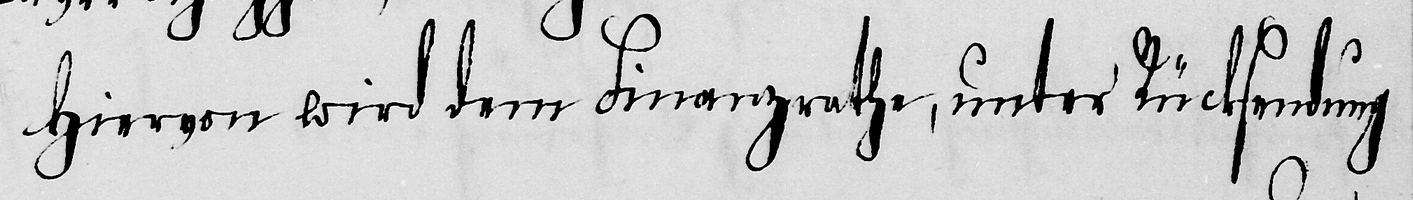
Hiervon wird dem Finanzrathe, unter Rücksendung
